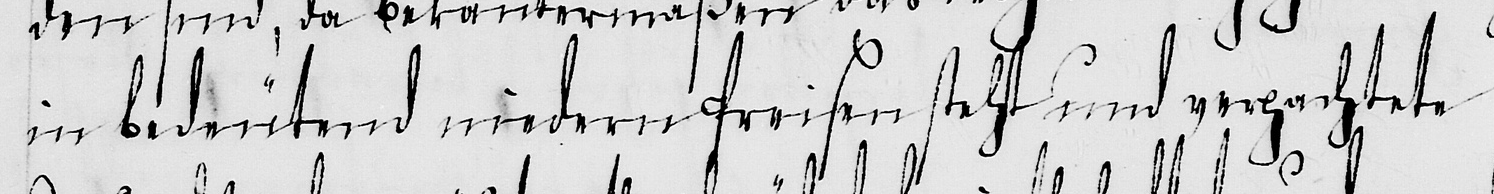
in bedeutend niedern Preisen steht und verpachtete
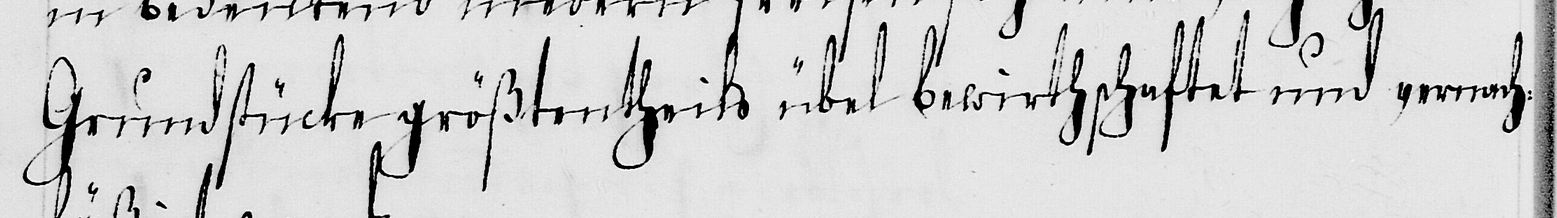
Grundstücke größtentheils übel bewirthschaftet und vernach¬
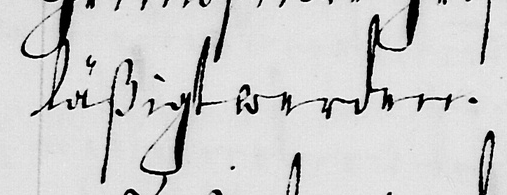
läßigt werden.
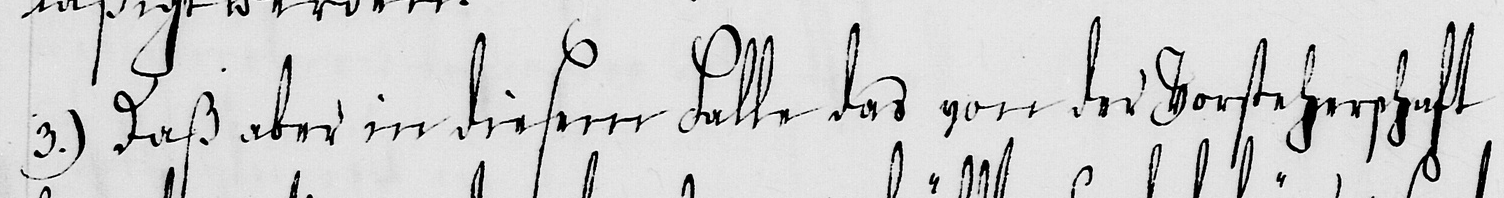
3.) Daß aber in diesem Falle das von der Vorsteherschaft
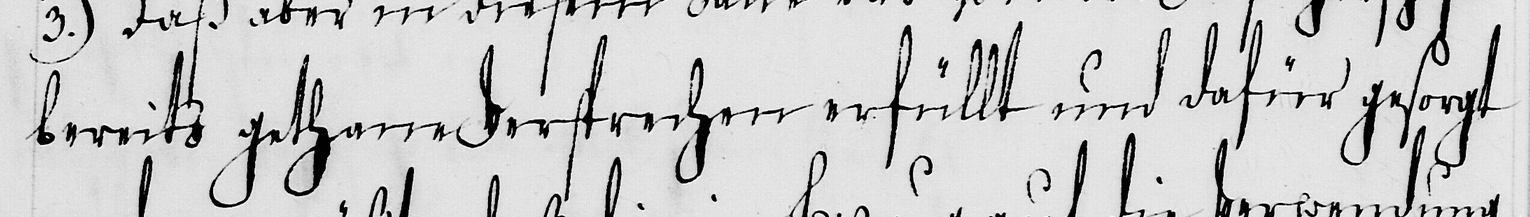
bereits gethane Versprechen erfüllt und dafür gesorgt
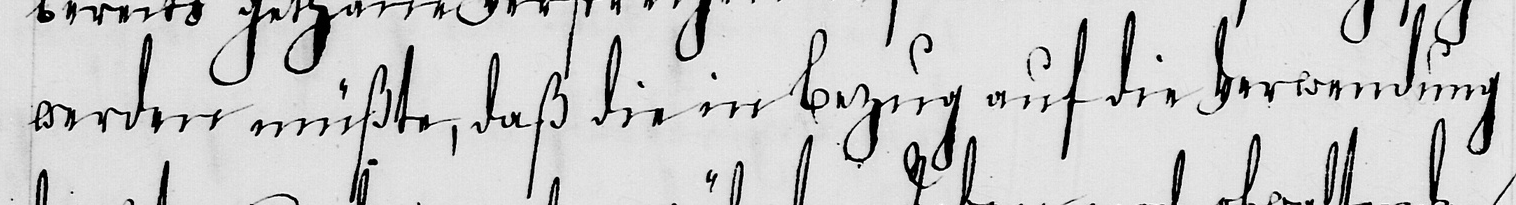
werden müßte, daß die in Bezug auf die Verwendung
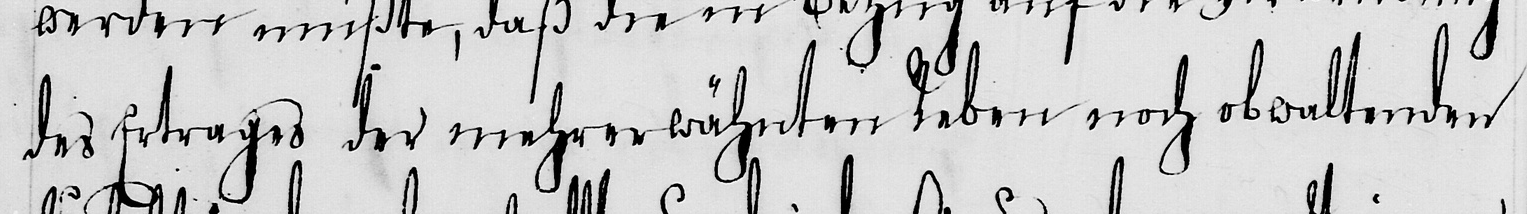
des Ertrages der mehrerwähnten Reben noch obwaltenden
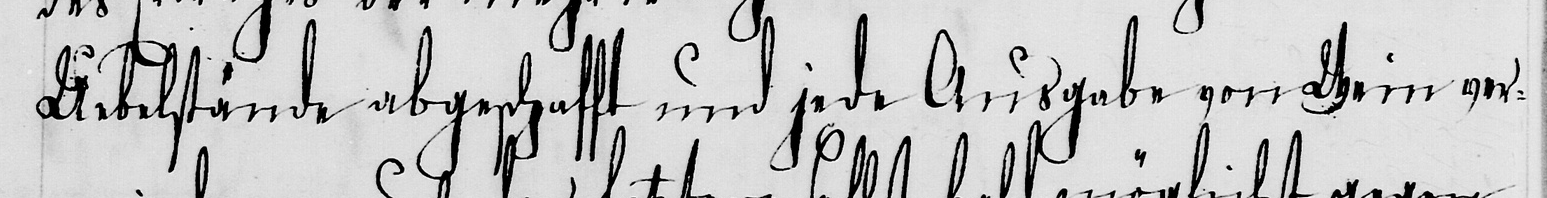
Uebelstände abgeschafft und jede Ausgabe von Wein ver¬
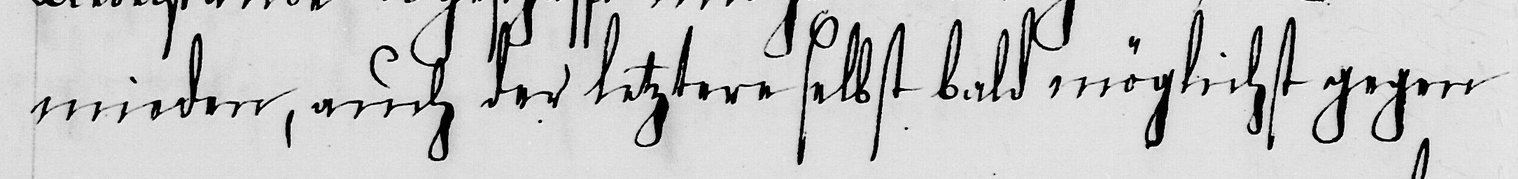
mieden, auch der letztere selbst bald möglichst gegen
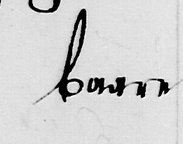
eren
